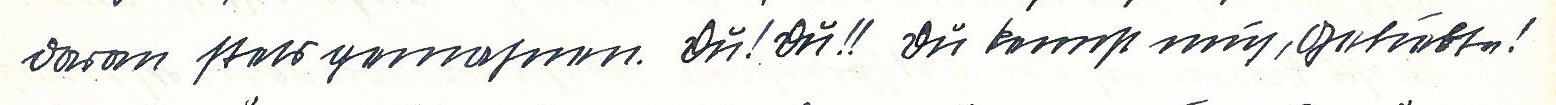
daran stets gemahnen. Du! Du!! Du kennst mich, Geliebte!
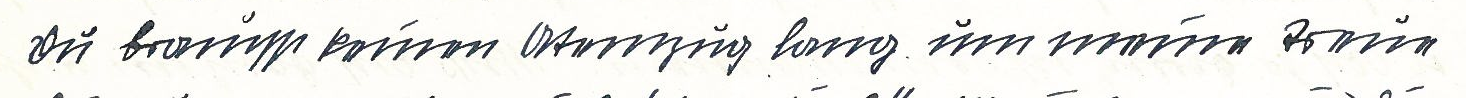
Du brauchst keinen Atemzug lang um meine Treue
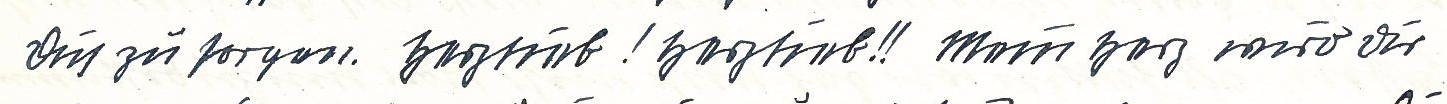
Dich zu sorgen. Herzlieb! Herzlieb!! Mein Herz wird Dir
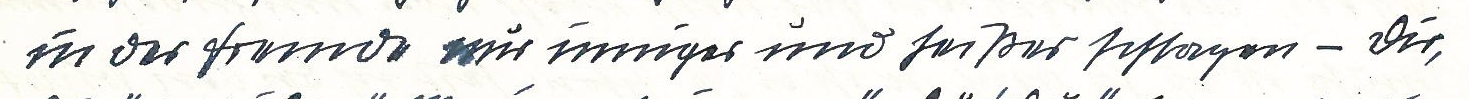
in der Fremde nur inniger schlagen – Dir,
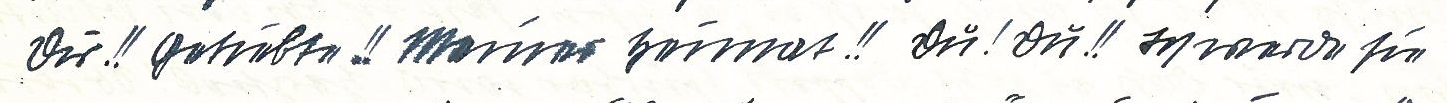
Dir!! Geliebte!! Meiner Heimat!! Du! Du!! Ich werde sie
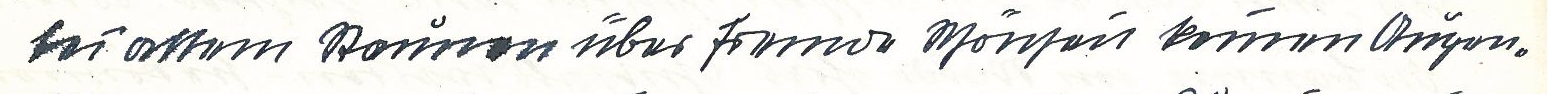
bei allem Staunen über fremde Schönheit keinen Augen¬
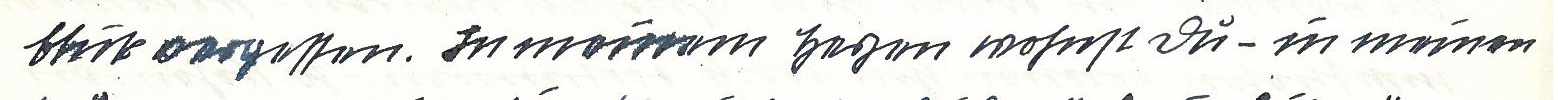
blick vergessen. In meinem Herzen wohnst Du – in meinen
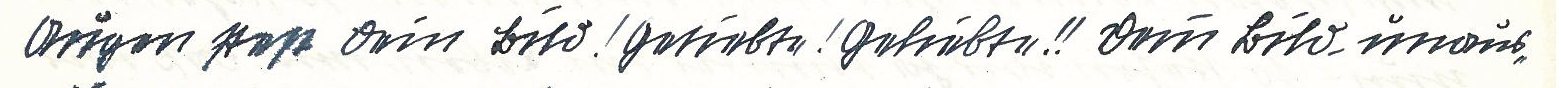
Augen steht Dein Bild! Geliebte! Geliebte!! Dein Bild, unaus¬
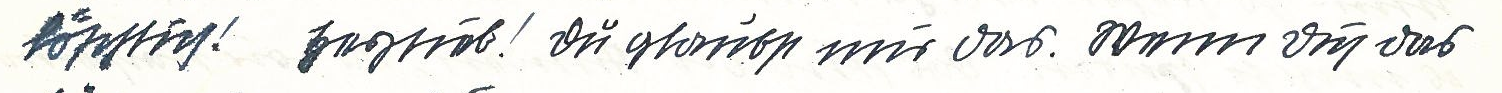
löschlich! Herzlieb! Du glaubst mir das. Wenn Dich das
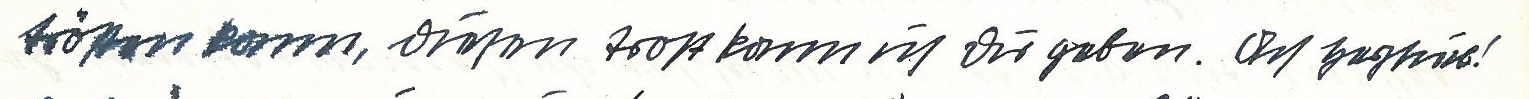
trösten kann, diesen Trost kann ich Dir geben. Ach Herzlieb!
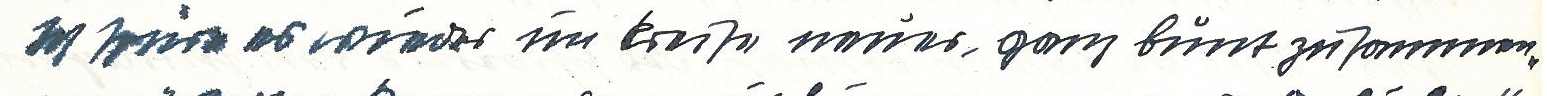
Ich spüre es wieder im Kreise neuer, ganz bunt zusammen¬
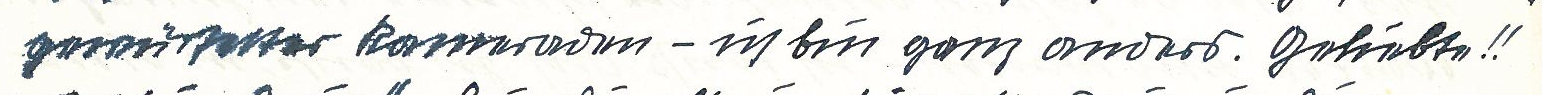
gewürfelter Kameraden – ich bin ganz anders. Geliebte!!
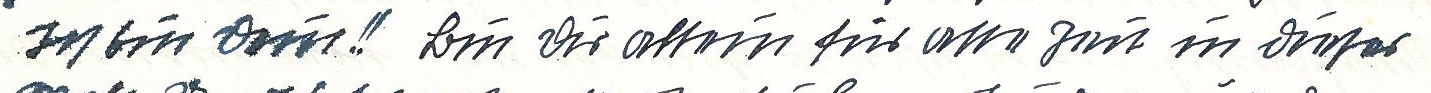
Ich bin Dein!! Bin Dir allein für alle Zeit in dieser
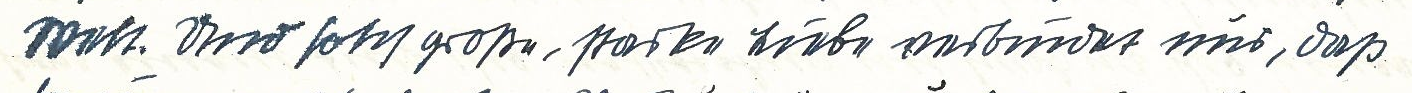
Welt. Und solch große, starke Liebe verbindet nur, daß
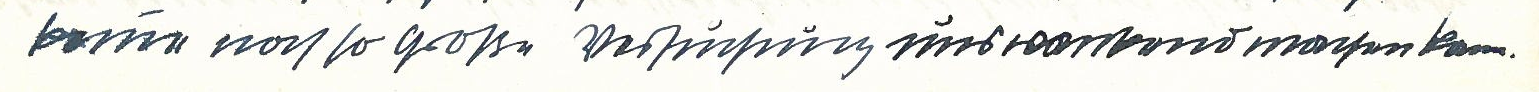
keine noch so große Versuchung uns wankend machen kann.
